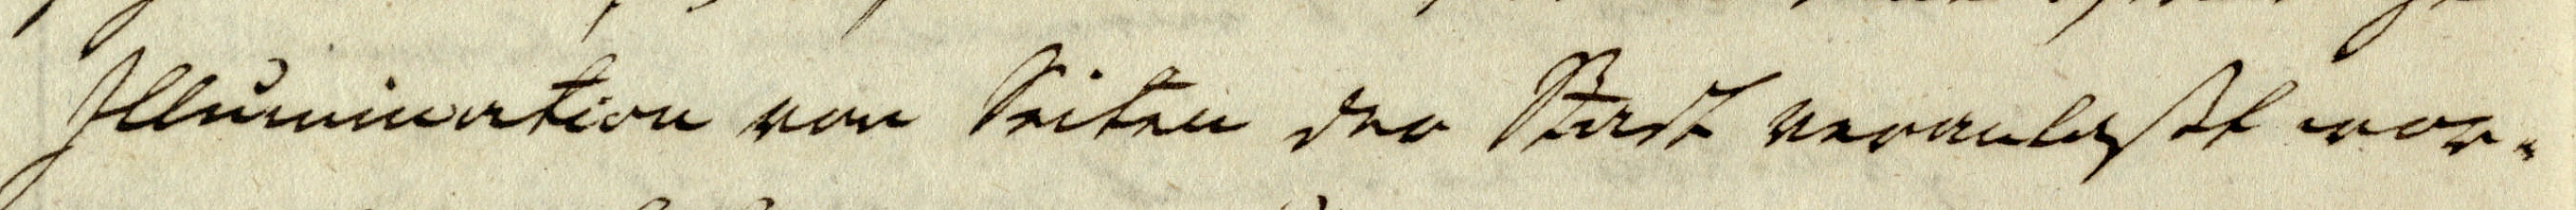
Illumination von Seiten der Stadt veranlaßt wor¬
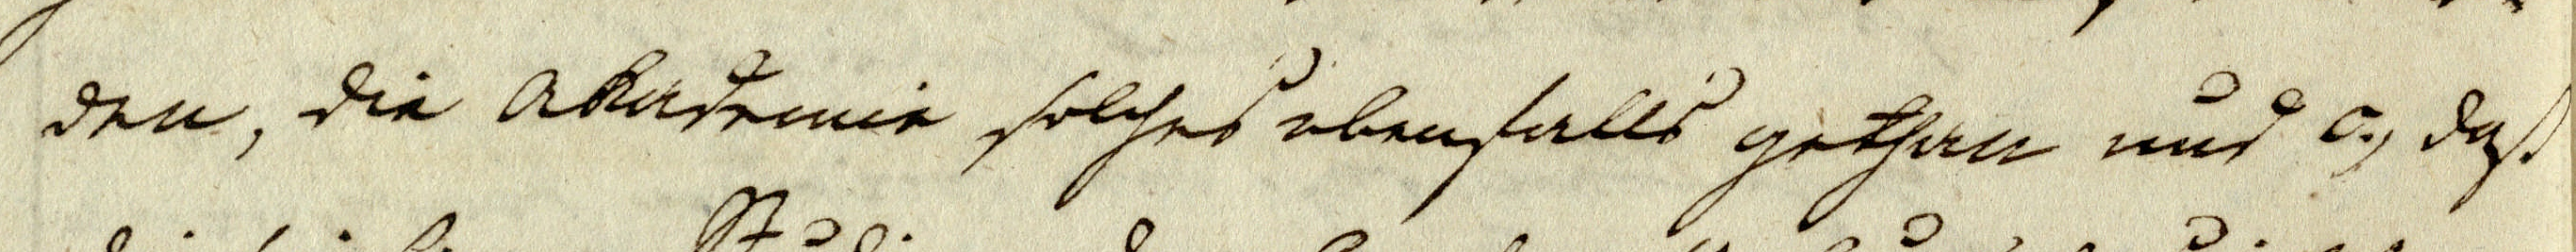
den, die Akademie solches ebenfalls gethan und c., daß
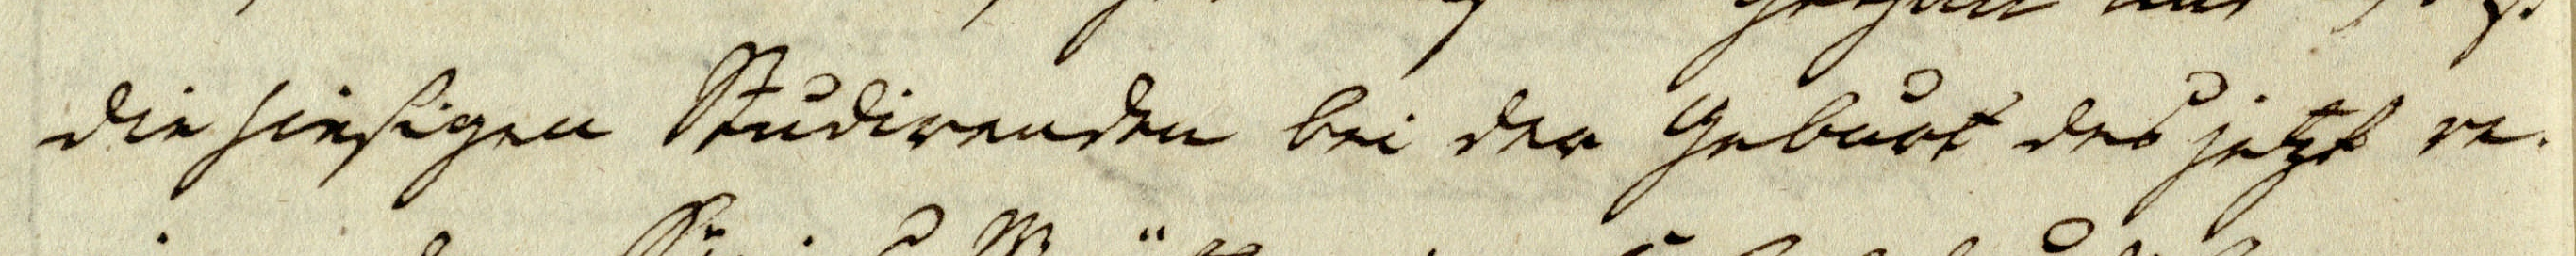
die hiesigen Studirenden bei der Geburt des jetzt re¬
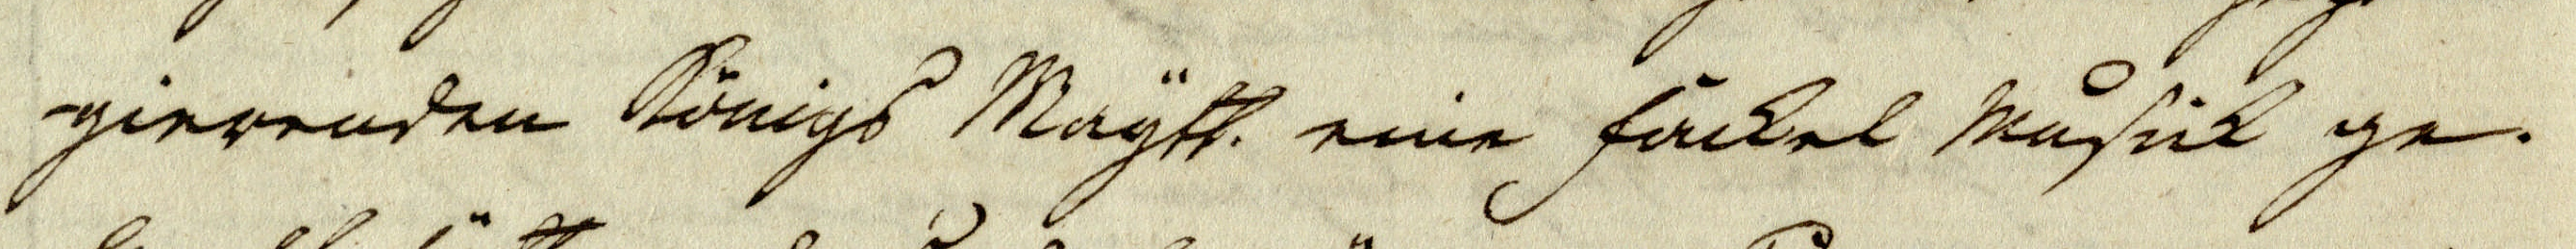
gierenden Königs Maÿtt. eine Fackel Musick ge¬
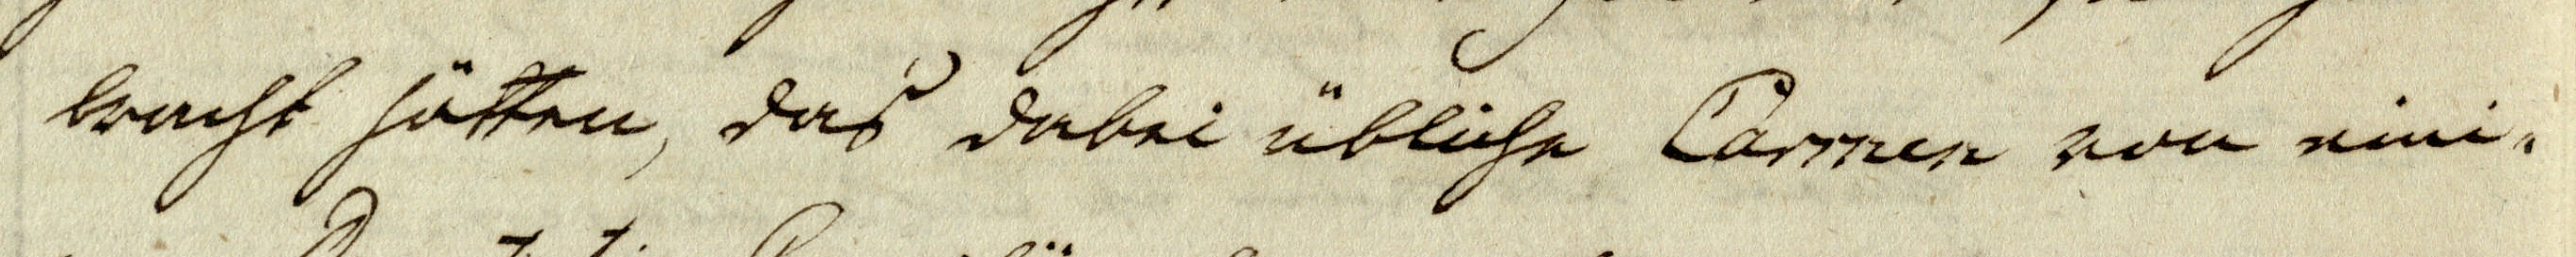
bracht hätten, das dabei nbliche Carmen von eini¬
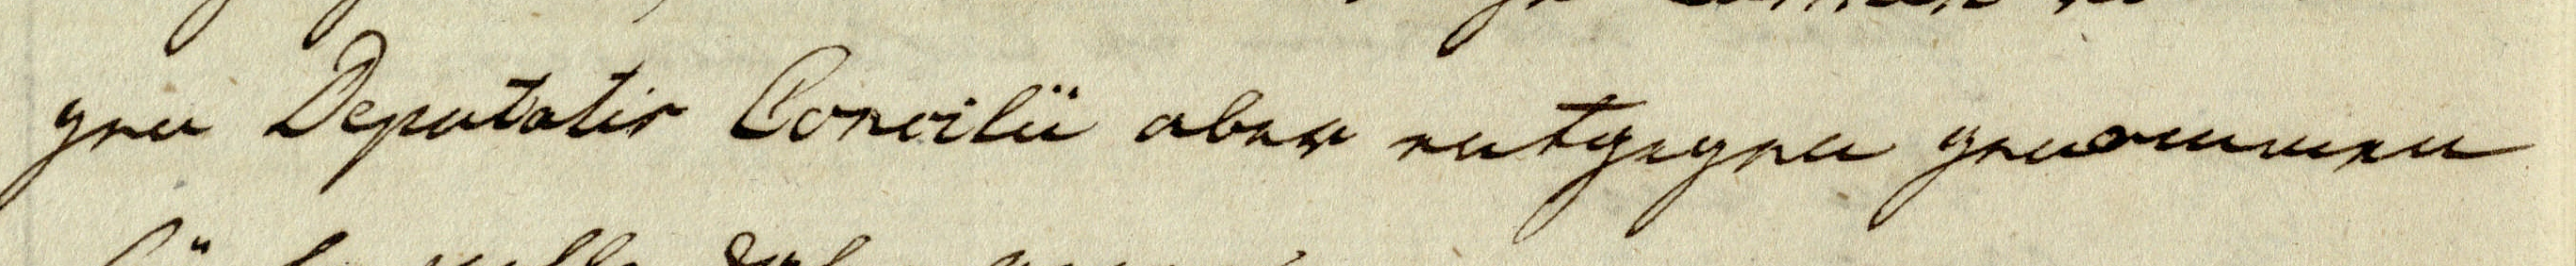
gen Deputatis Concilii aber entgegen genommen
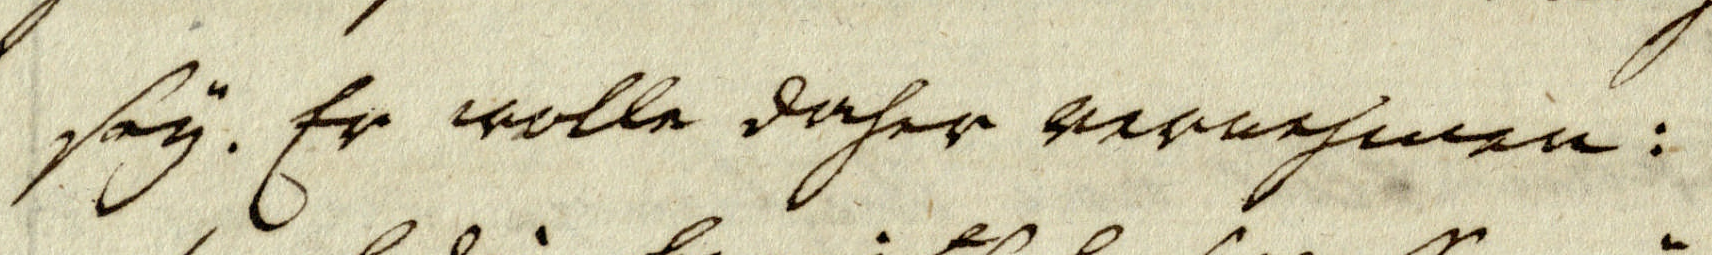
seÿ. Er wolle daher vernehmen:
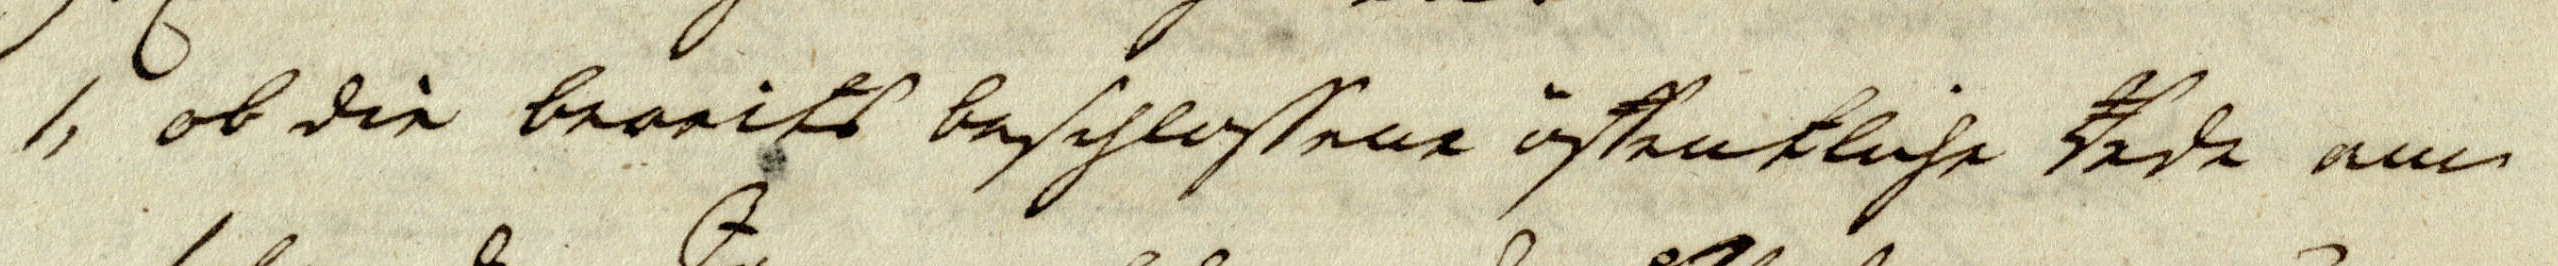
1, ob die bereits beschlossene öffentliche Rede am
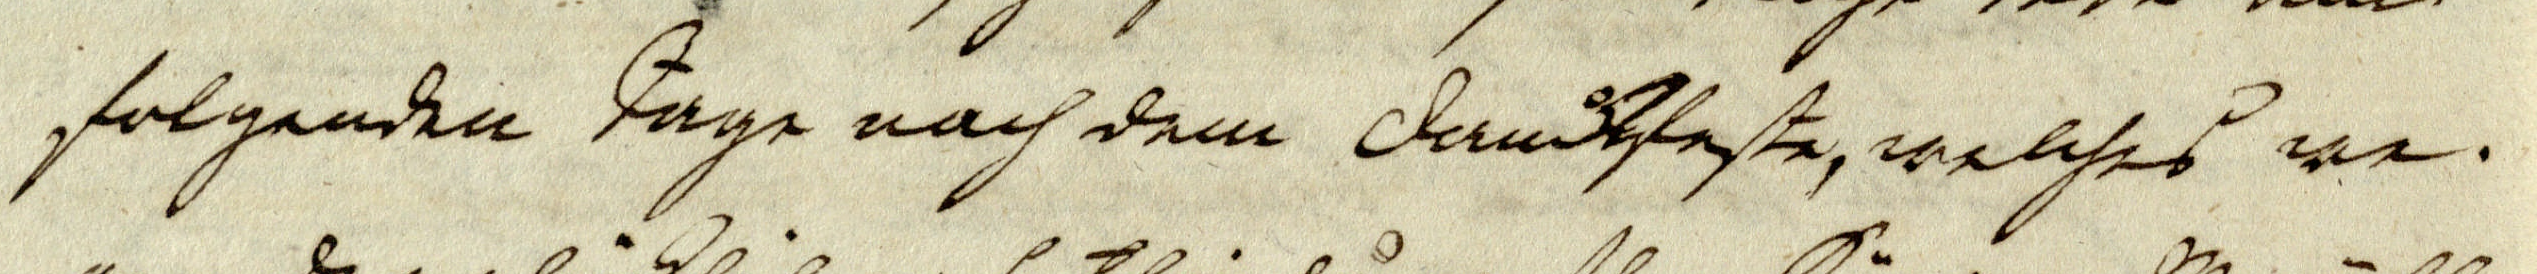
folgenden Tage nach dem Danckfeste, welches we¬
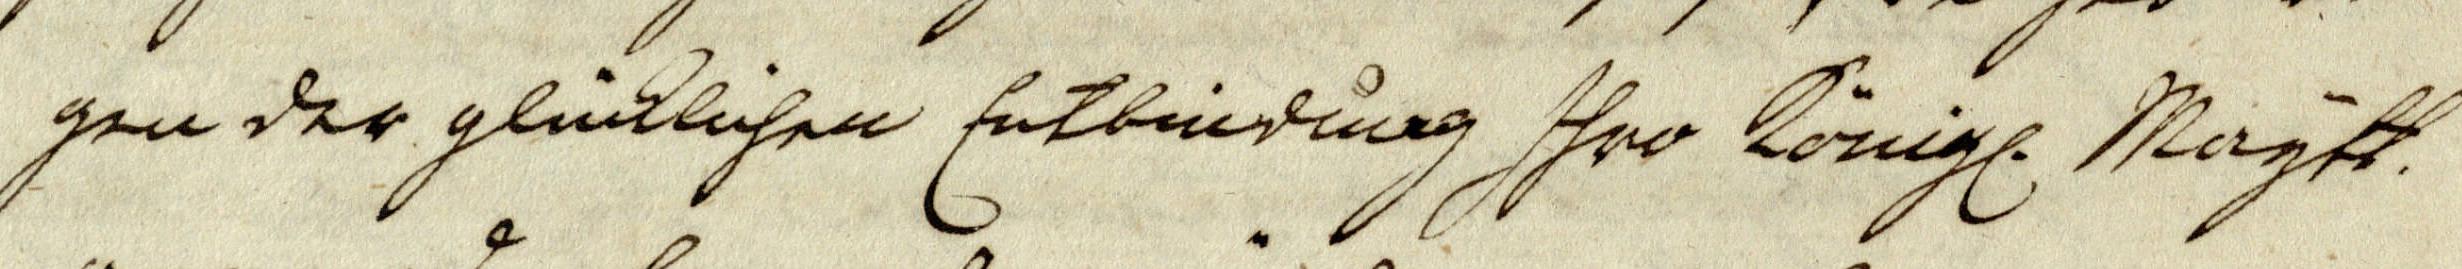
gen der glücklichen Entbindung Ihro Königl. Maÿtt.
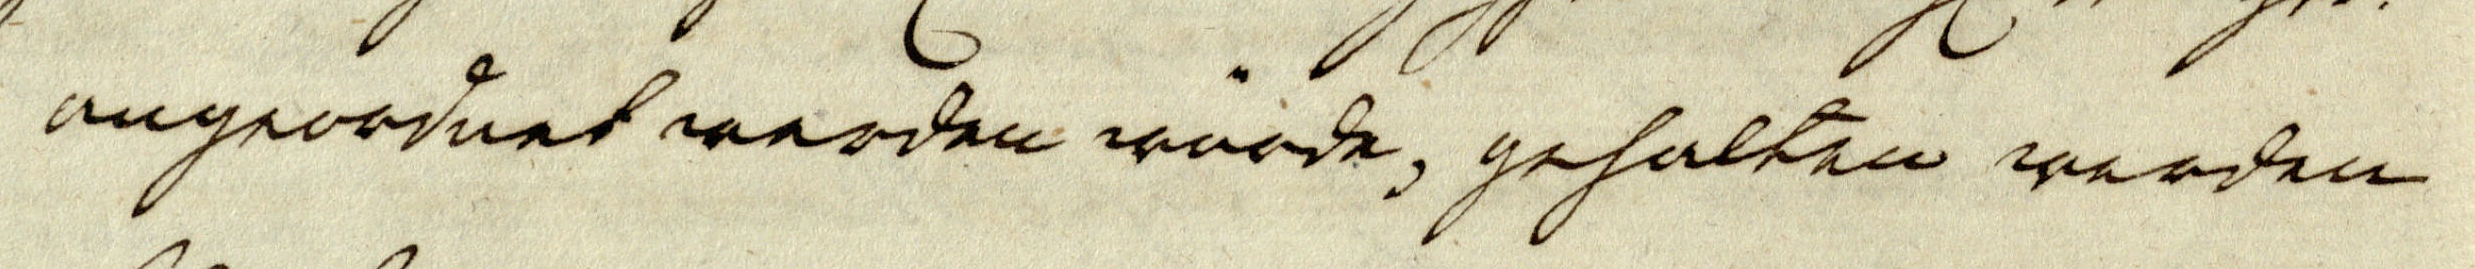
angeordnet werden würde, gehalten werden
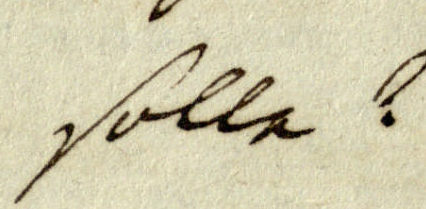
solle?
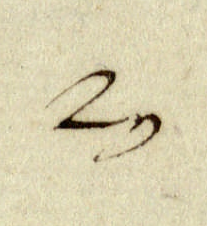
2,
